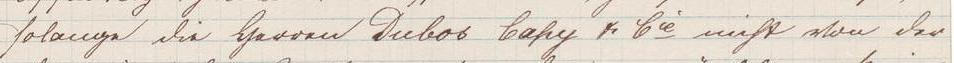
solange die Herren DubosCapy & Cie nicht von der
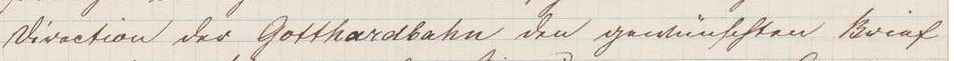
Direction der Gotthardbahn den gewünschten Brief
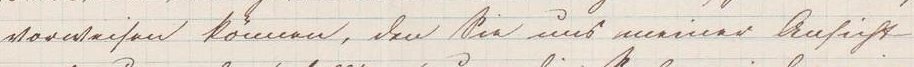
vorweisen können, den Sie uns meiner Ansicht
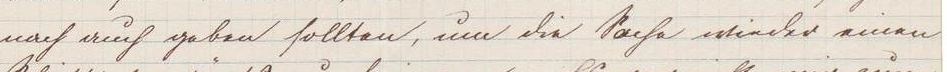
nach auch geben sollten, um die Sache wieder einen
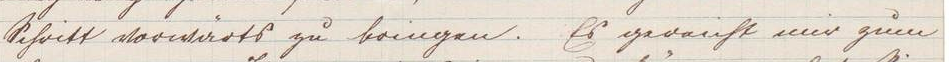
Schritt vorwärts zu bringen. Es gereicht mir zum
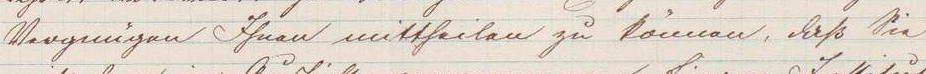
Vergnügen Ihnen mittheilen zu können, dass Sie
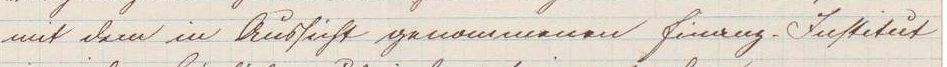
mit dem in Aussicht genommenen Finanz–Institut
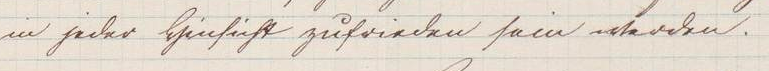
in jeder Hinsicht zufrieden sein werden.
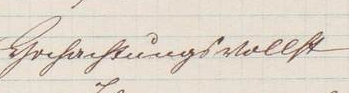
Hochachtungsvollst
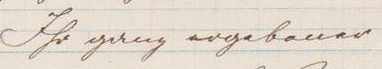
Ihr ganz ergebener
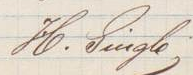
H. Single.
